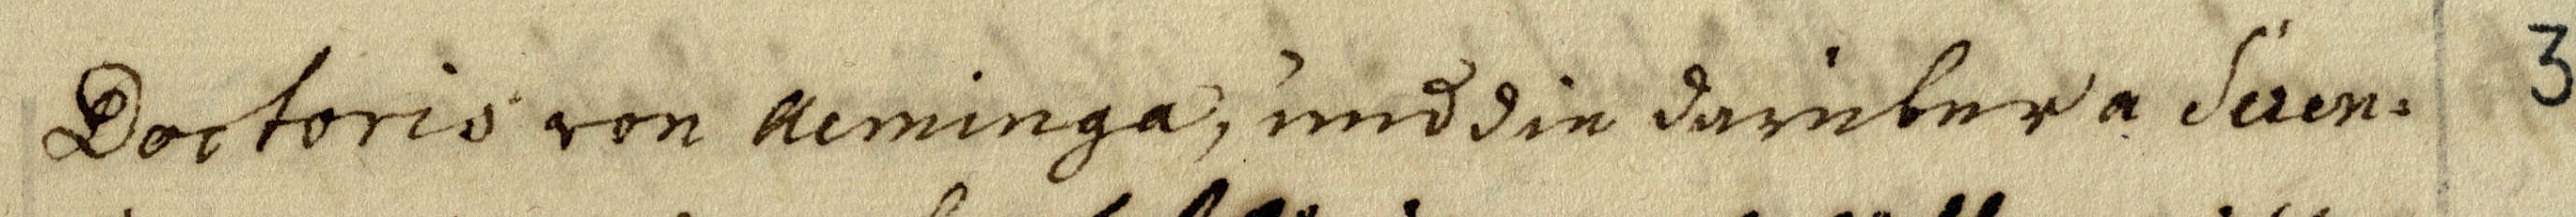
Doctoris von Aeminga, und die darüber a Seren.
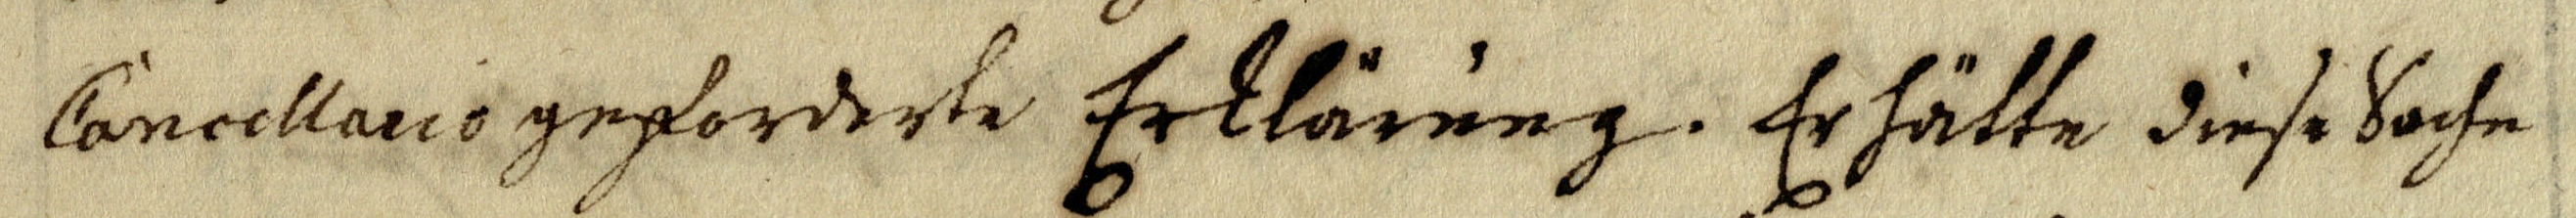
Cancellario geforderte Erklärung. Er hätte diese Sache
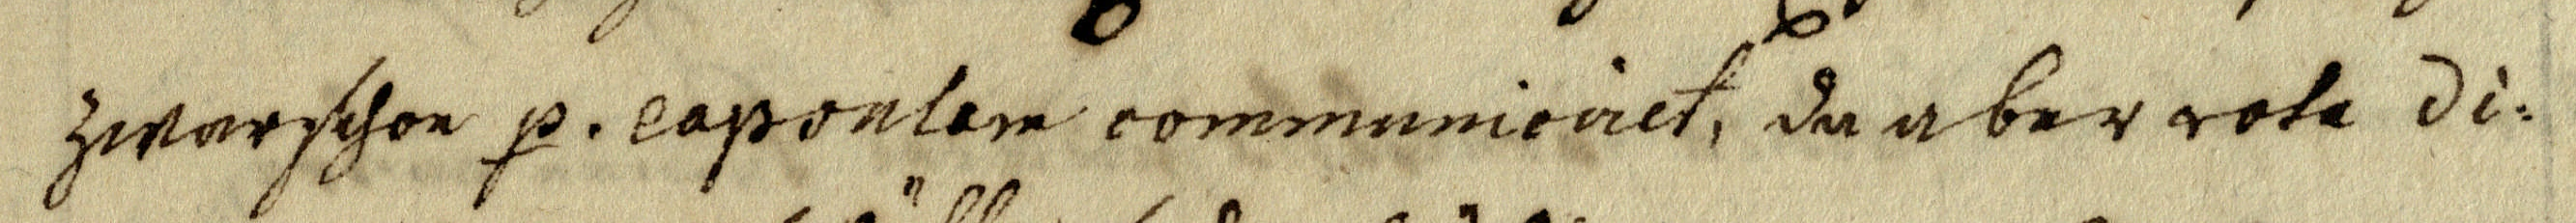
zwar schon p. capsulam communiciret, da aber vota di¬
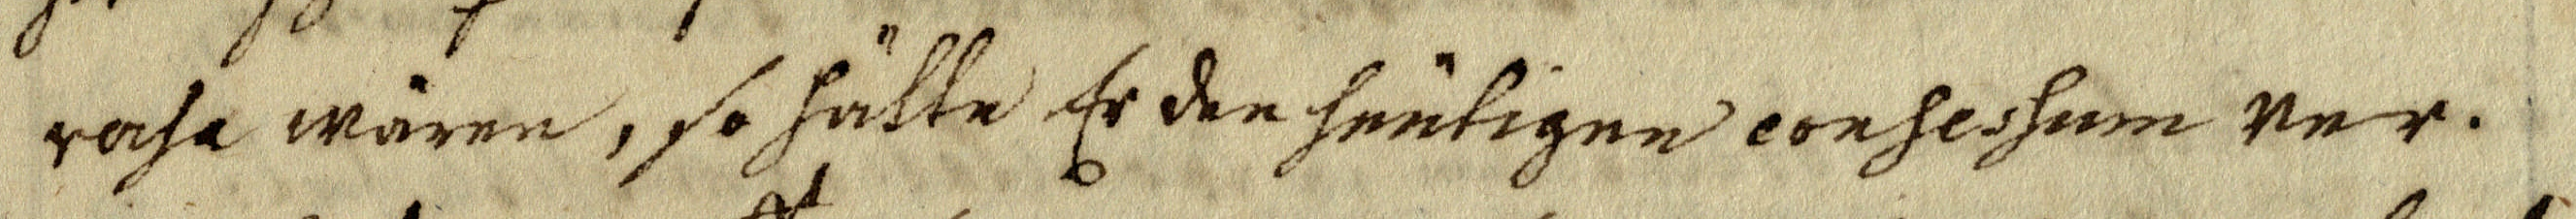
versa wären, so hätte Er den heutigen consessum ver¬
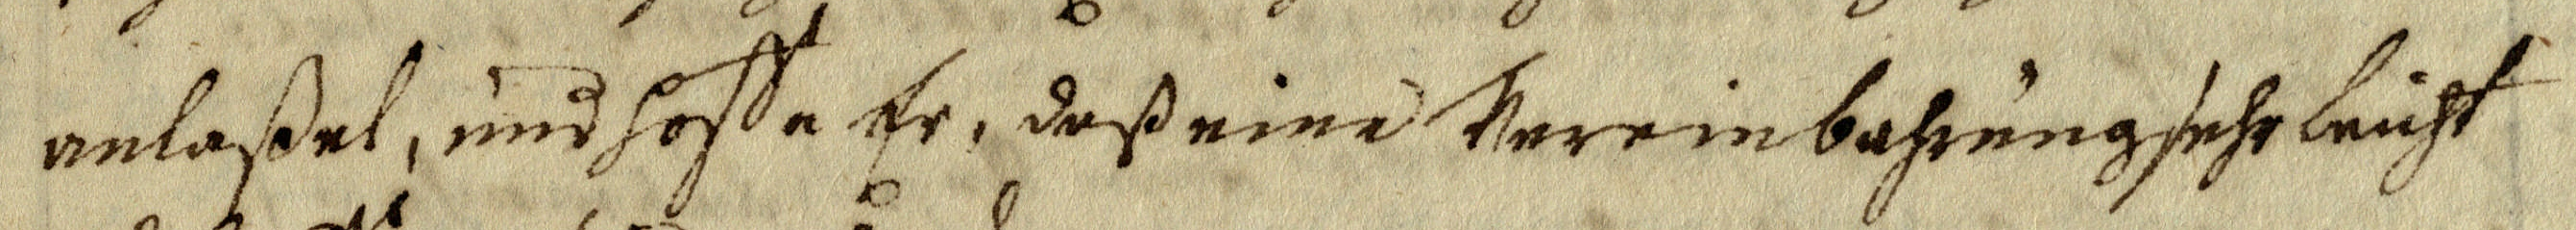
anlaßet, und hoffe Er, daß eine Vereinbahrung sehr leicht
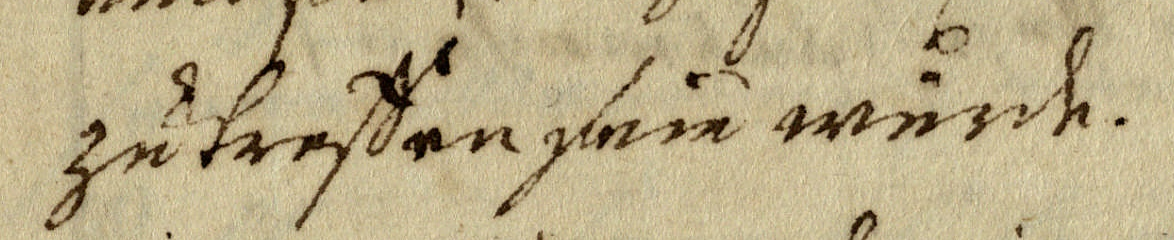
zu treffen sein würde.
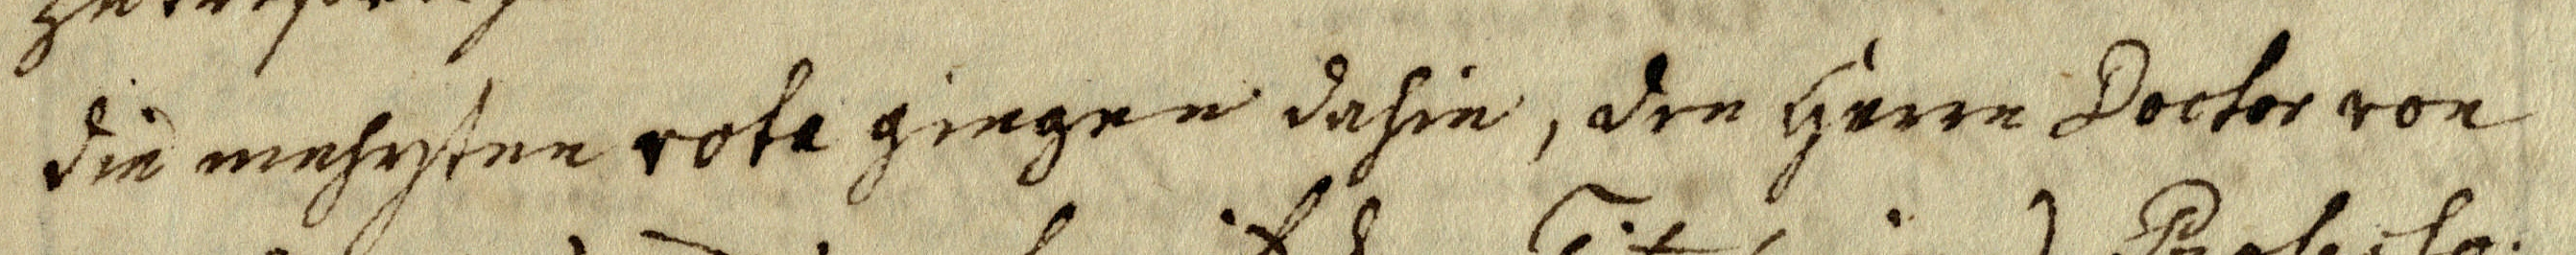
Die mehrsten vota gingen dahin, den Herrn Doctor von
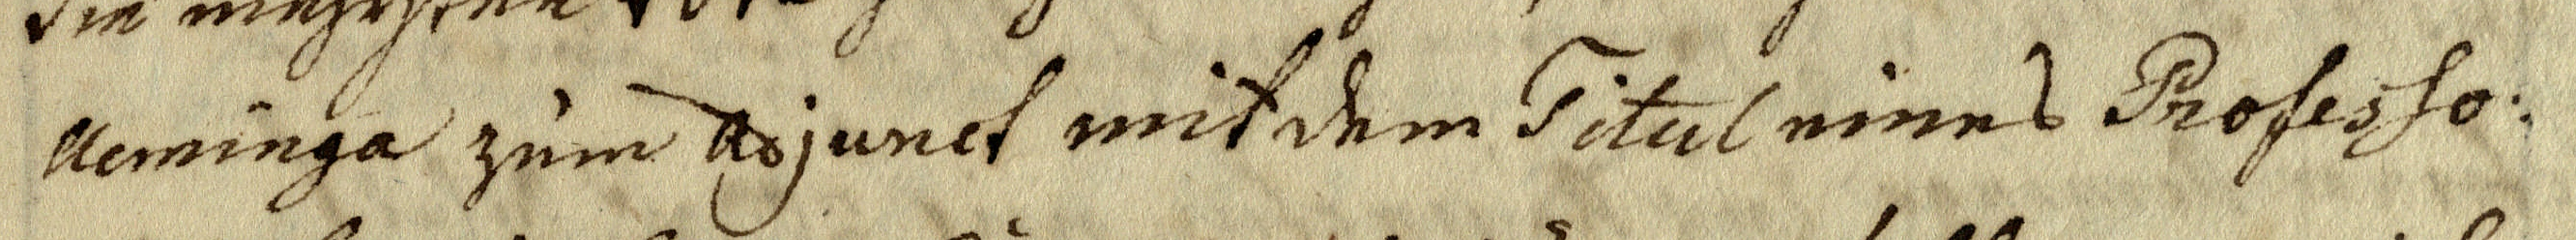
Aeminga zum Adjunct mit dem Titul eines Professo¬
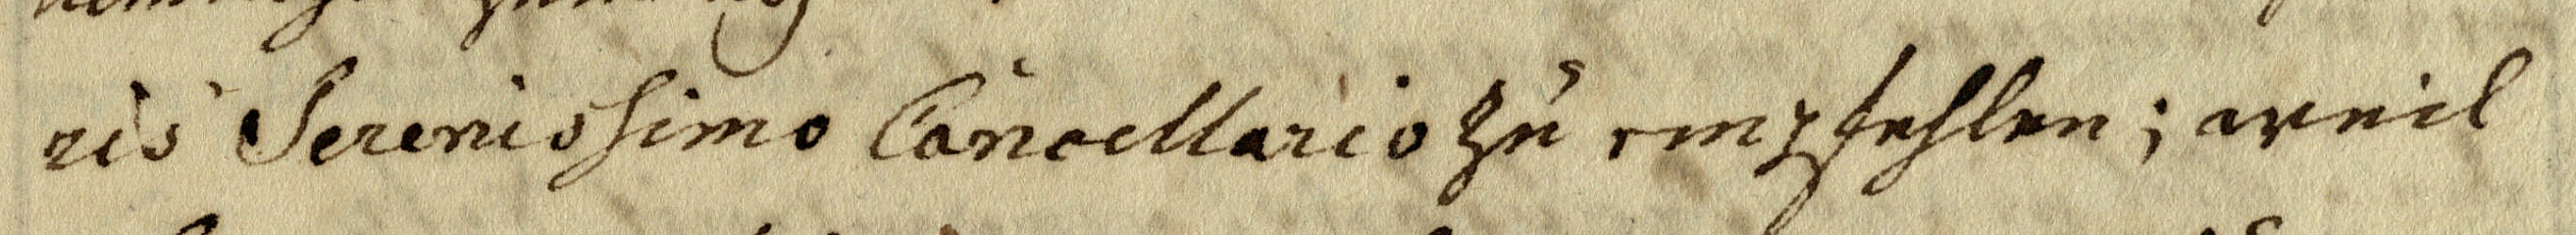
ris Serenissimo Cancellario zu empfehlen; weil
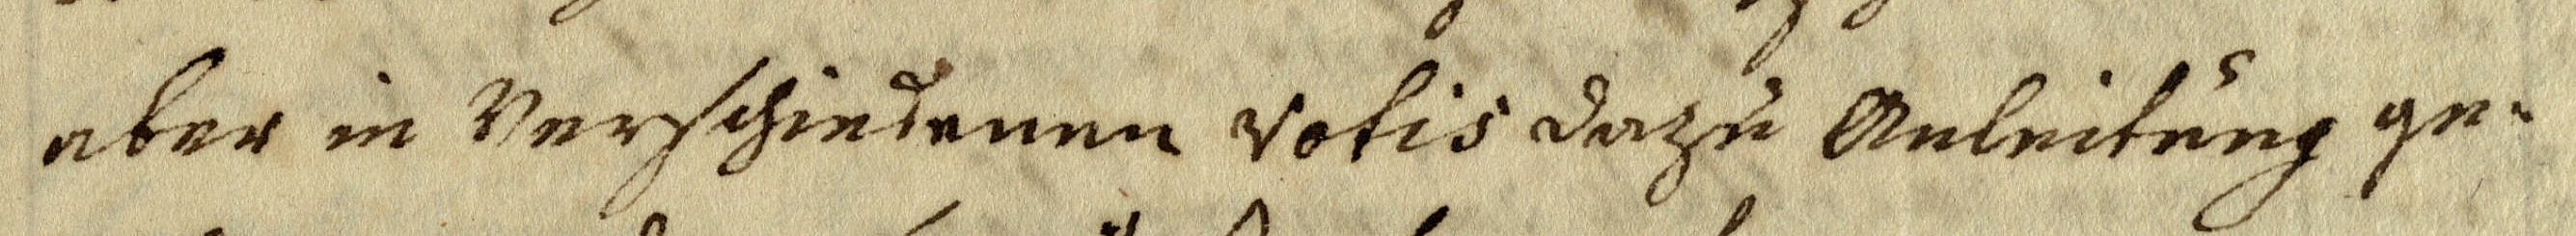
aber in verschiedenen Votis dauz Anleitung ge¬
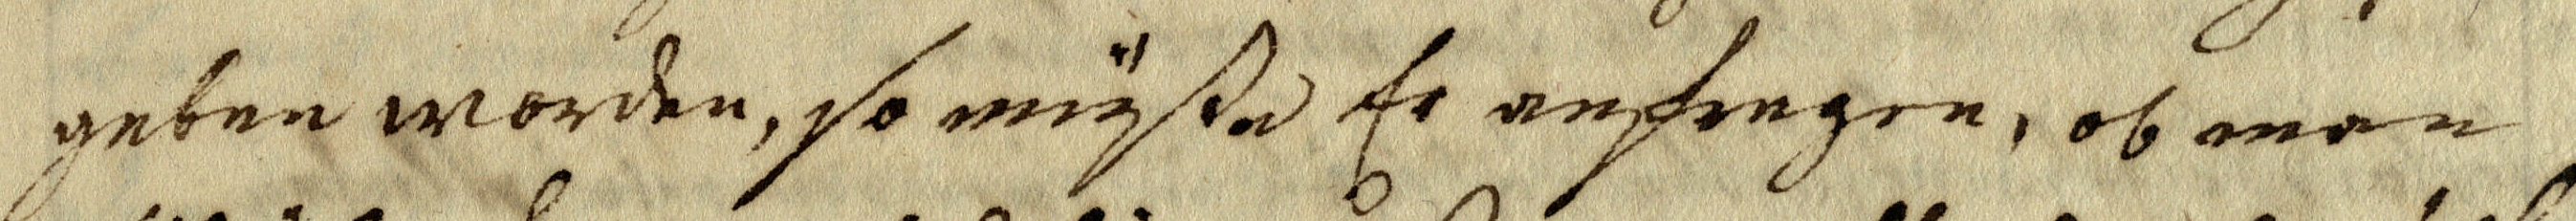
geben worden, so müste Er anfragen, ob man
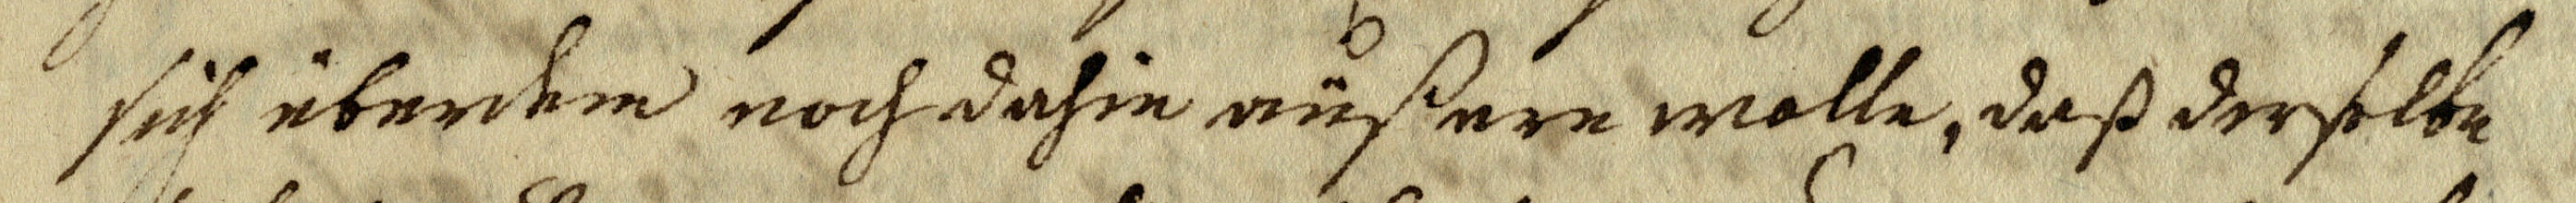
sich überdem noch dahin äußern wolle, daß derselbe
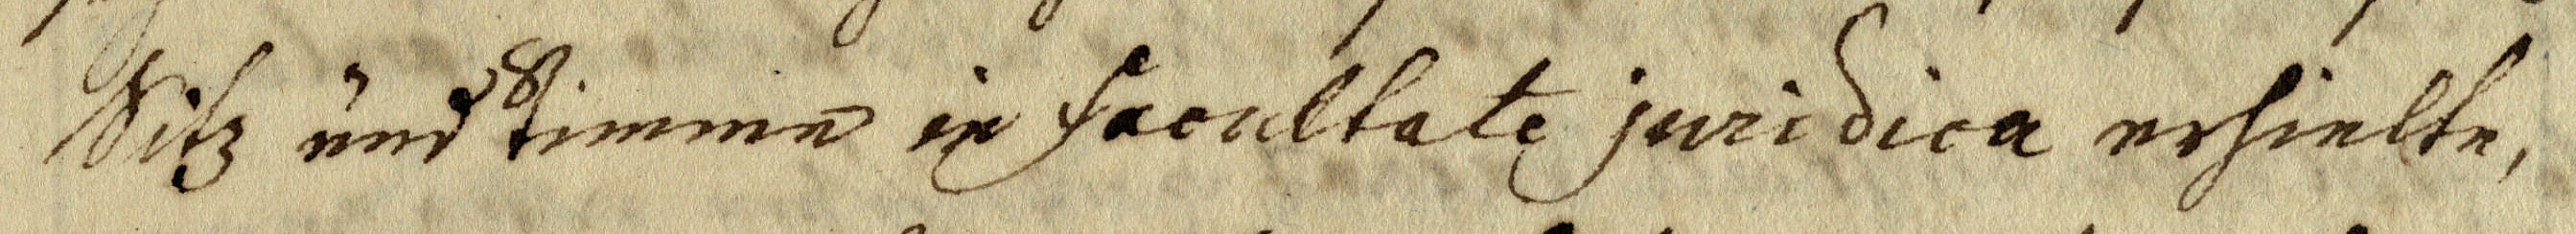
Sitz und Stimme in Facultate juridica erhielte,
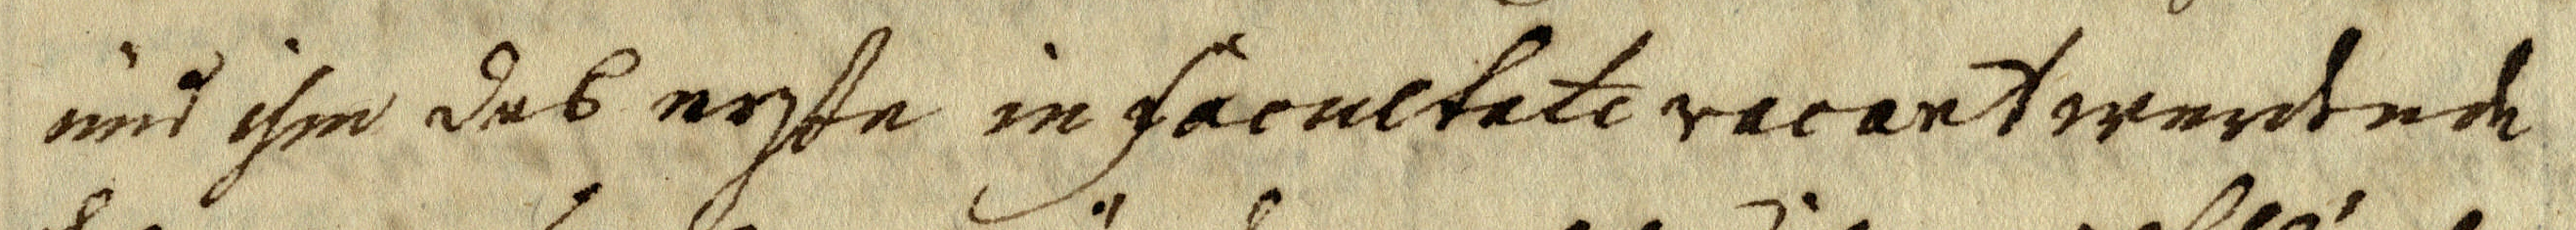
und ihm das erste in Facultate vacant werdende
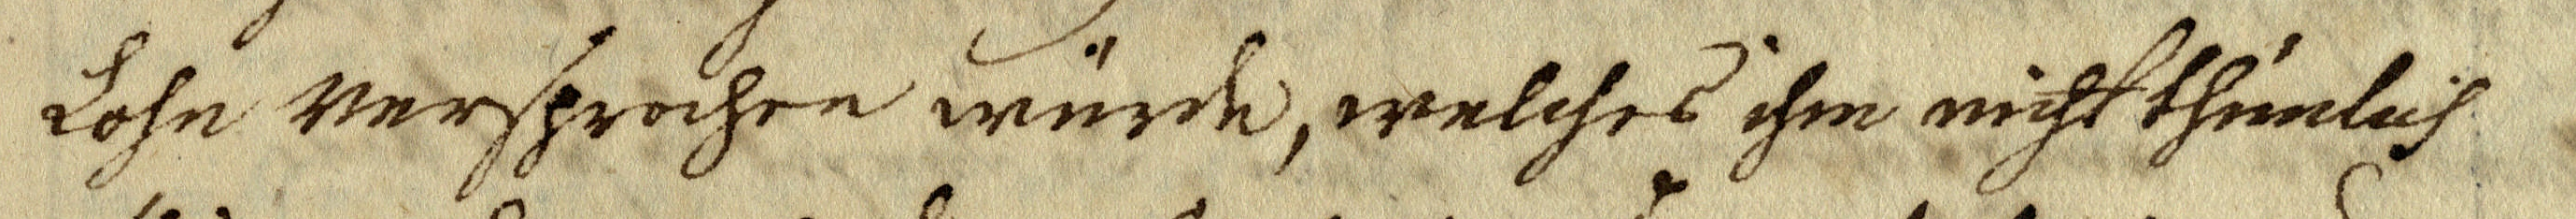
Lohn versprochen würde, welches ihm nicht thunlich
